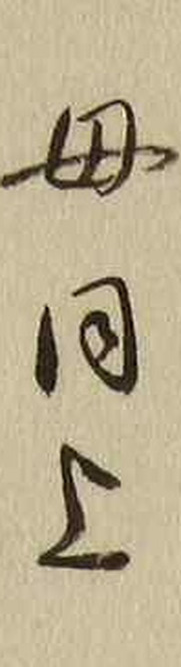母同上
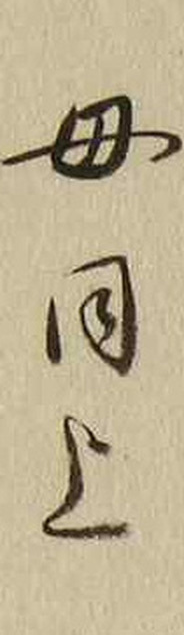母同上
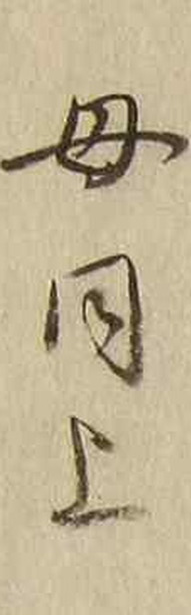母同上

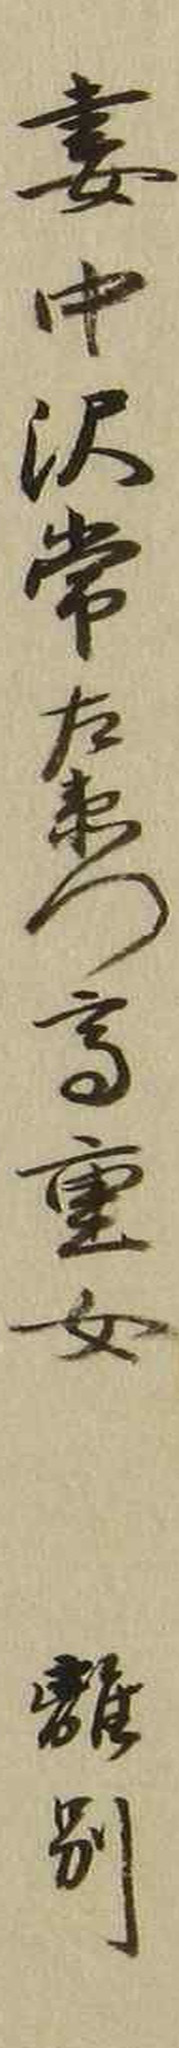妻中沢常左衛門高重女離別
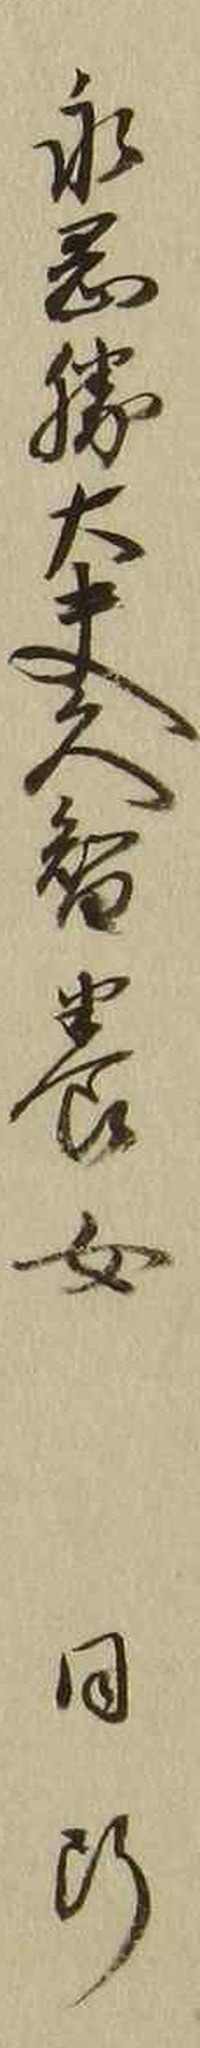永岡勝大夫久智養女同断
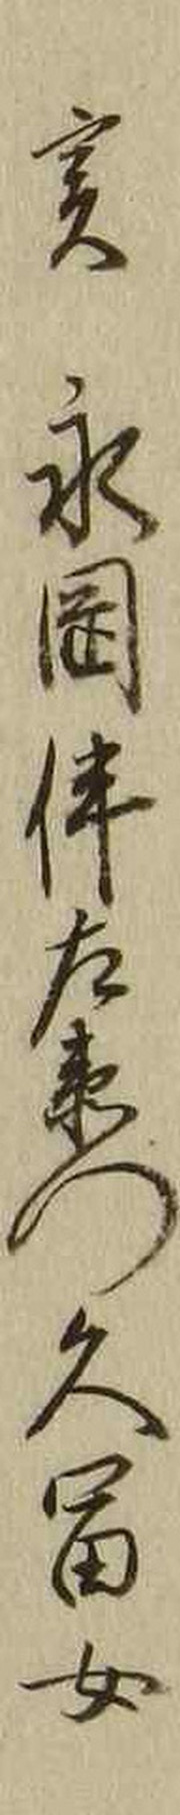実永岡伴左衛門久富女
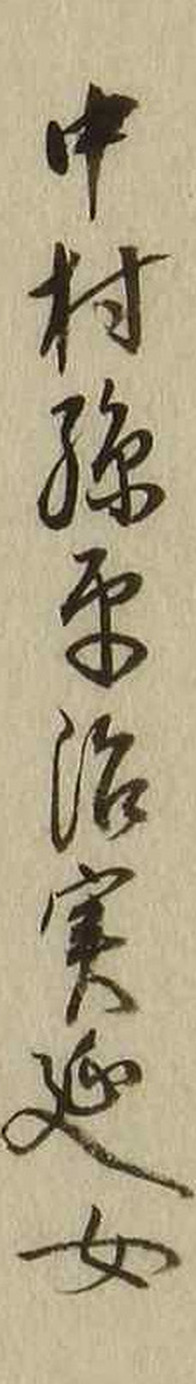中村孫平次実延女
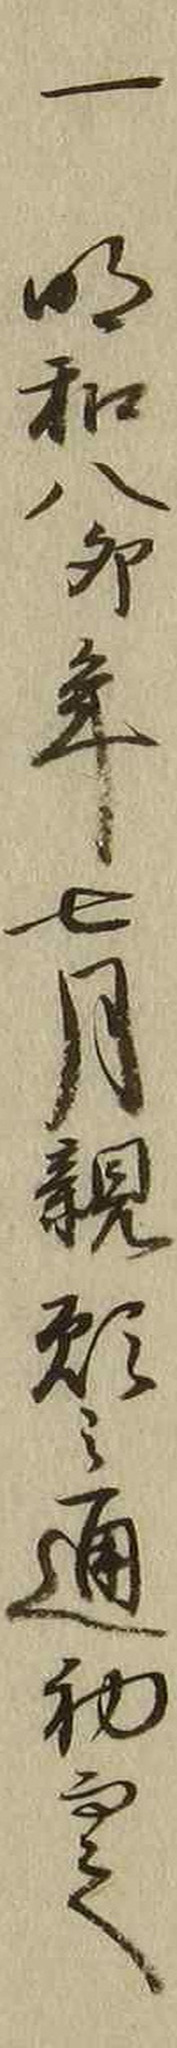一明和八卯年七月親願之通初而之
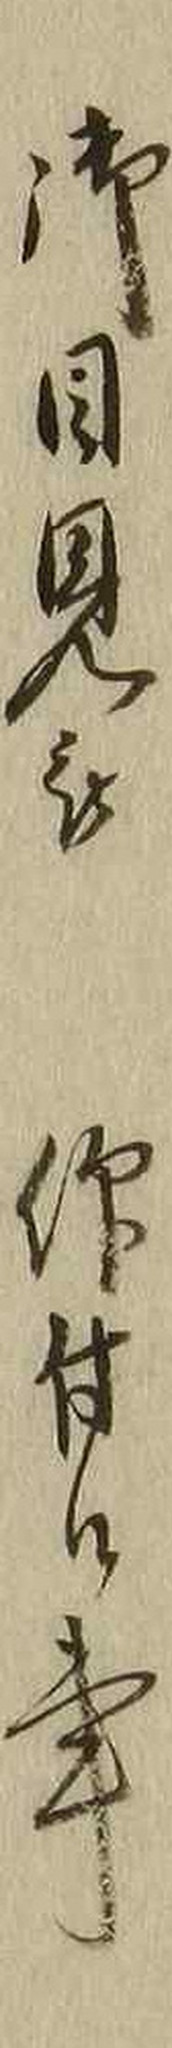御目見被仰付候事
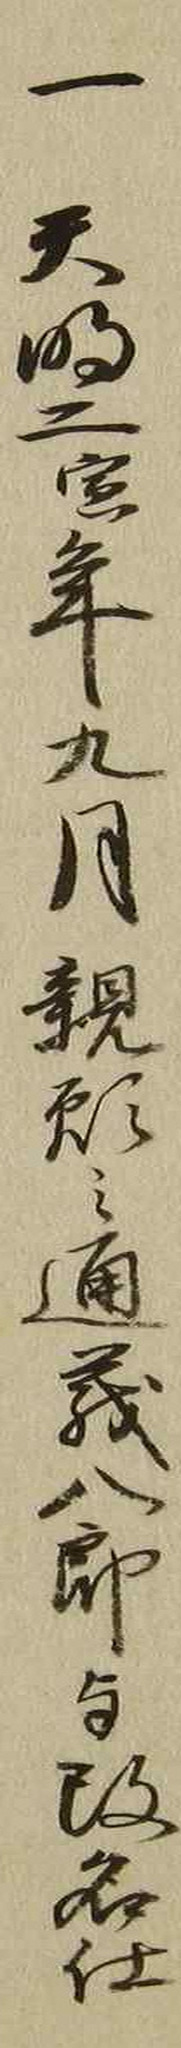一天明二寅年九月親願之通義八郎与改名仕
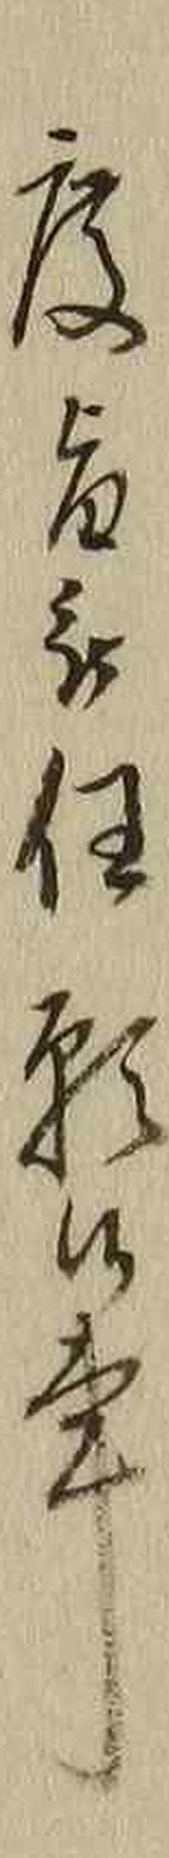度旨被任願候事
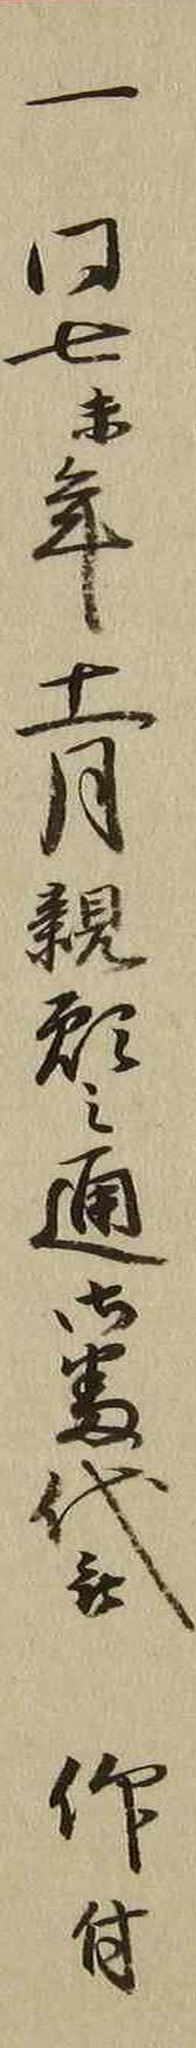一同七未年十一月親願之通御番代被仰付
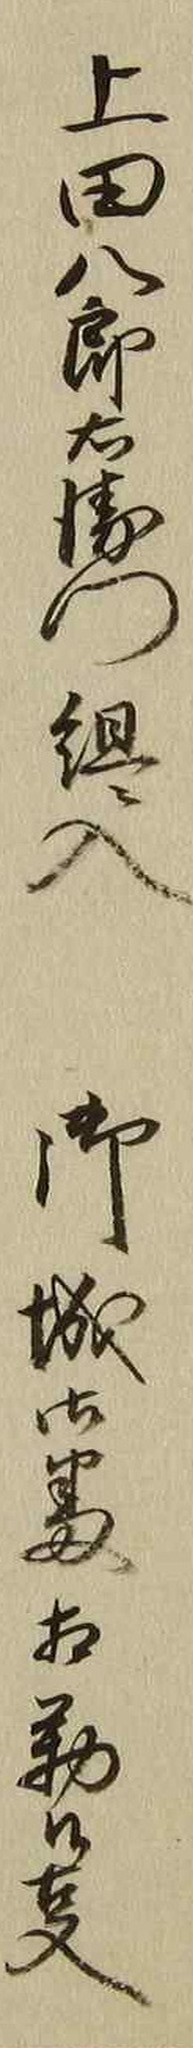上田八郎右衛門組ニ入御城御番相勤候事
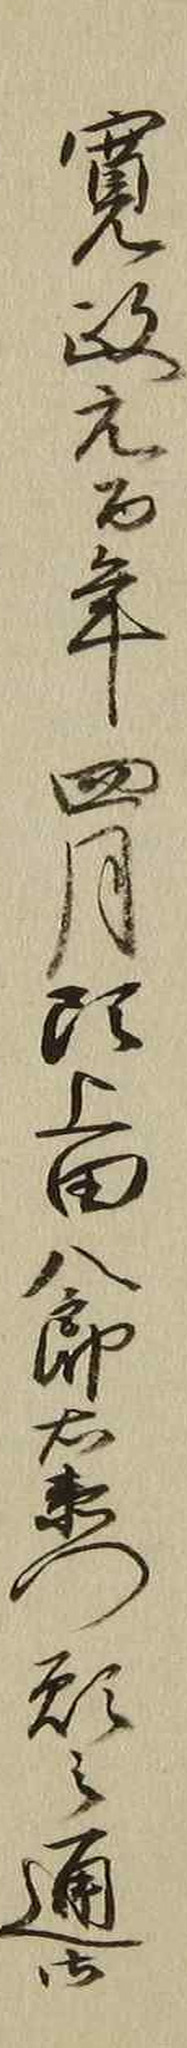一寛政元酉年四月頭上田八郎右衛門願之通御
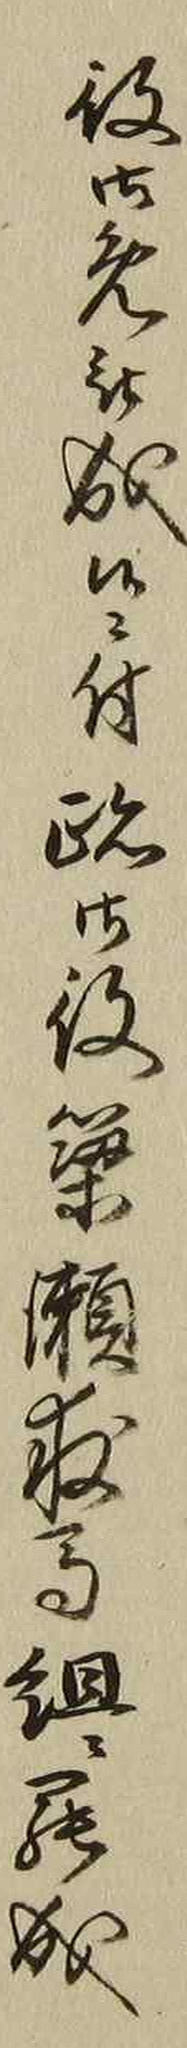役御免被成候ニ付跡御役簗瀬求馬組ニ罷成
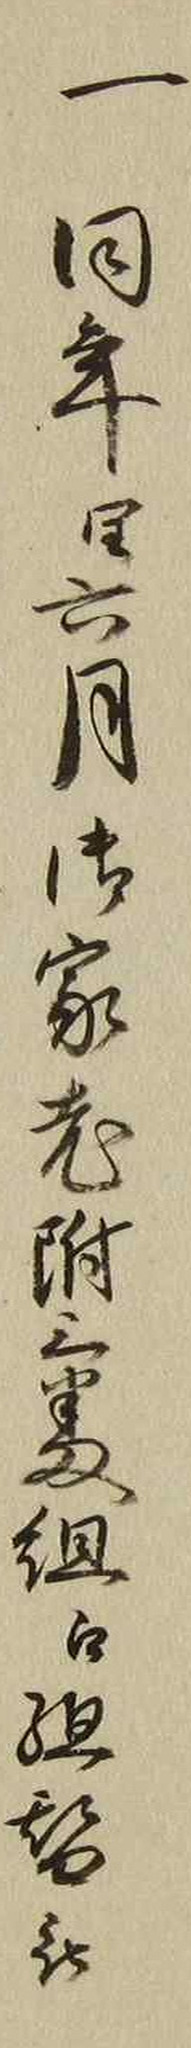一同年閏六月御家老附三番組江組替被
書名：諸士系譜　巻之128　た之部4
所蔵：会津若松市立会津図書館
